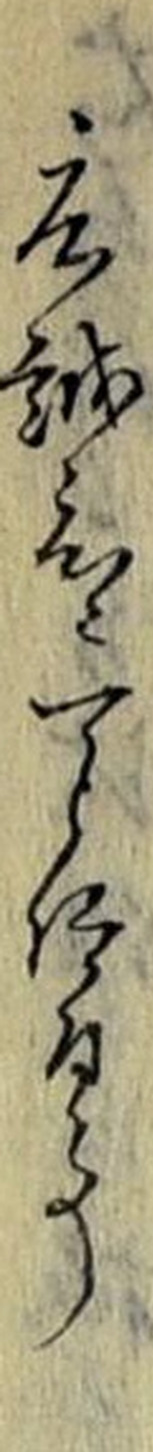度越度に可被仰付候事
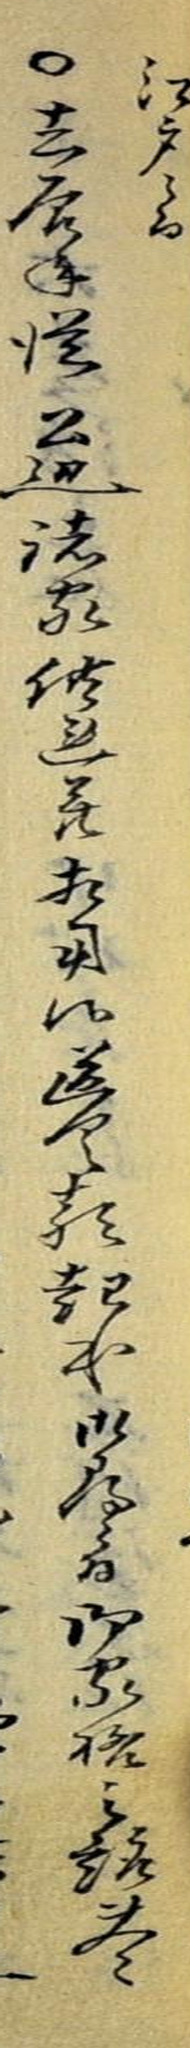○去辰年従公辺諸家供連并相用候道具類起本御尋に付御家格之趣夫々
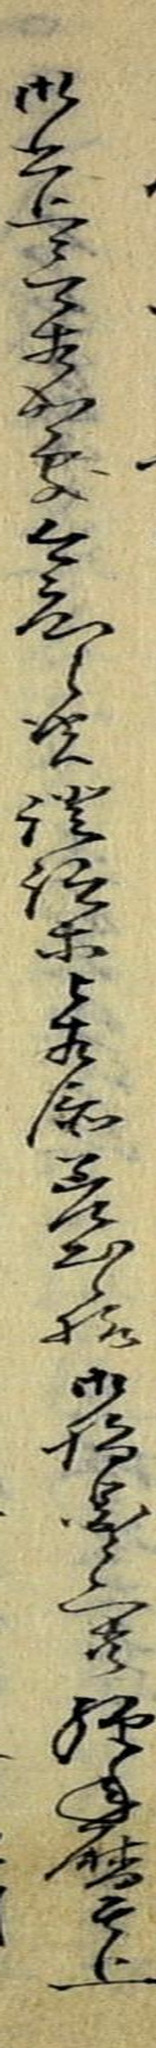御書上に可相成処今度之儀は證跡等被相添差出候様御指図に候へ共経年歴其上
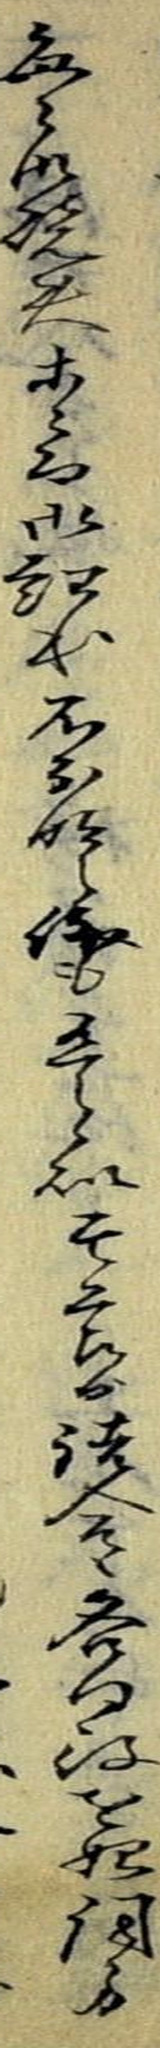毎々御焼失等に而御起本不分明之儀も有之候処其節ゟ詰合候各同役を始調方
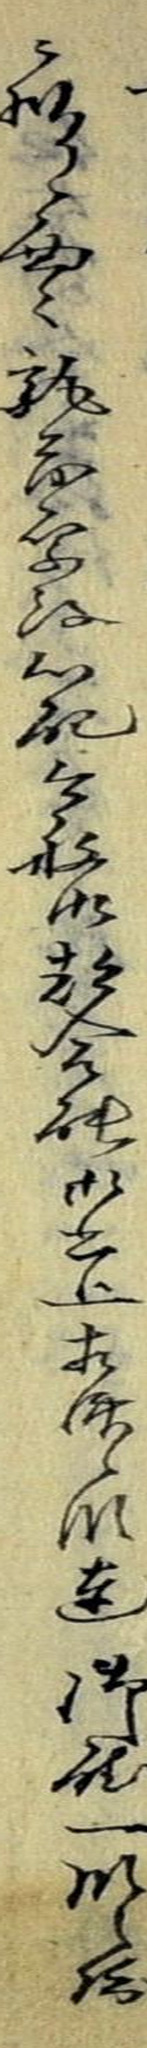に掛り之面々孰も厚致心配今般御都合能御書上相済候段達御聴一段之儀
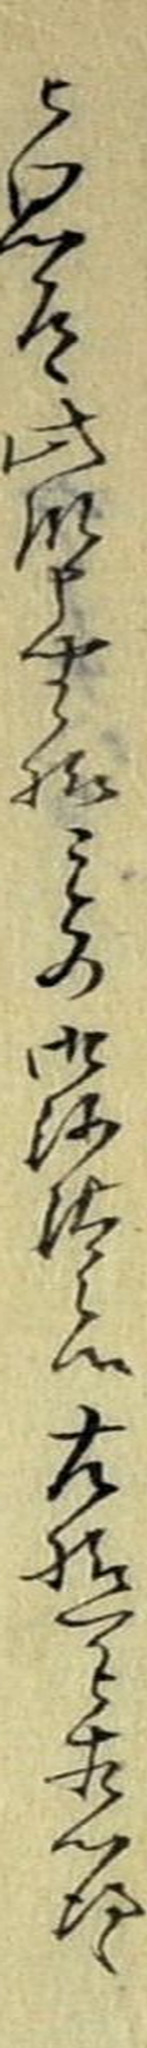被思召候此段申聞候様にとの御沙汰に候左様可被相心得候
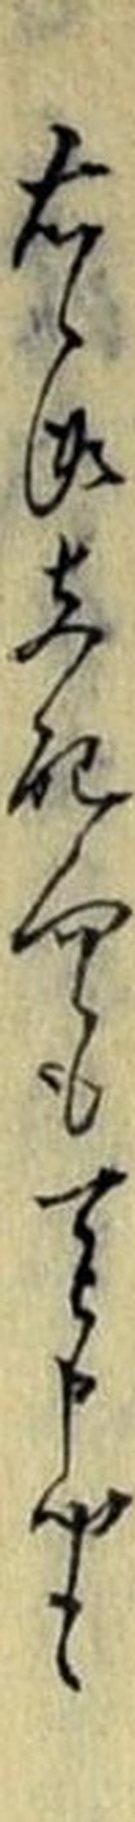右之趣支配向へも可被申聞候
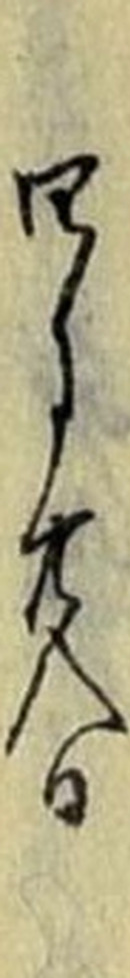四月廿八日

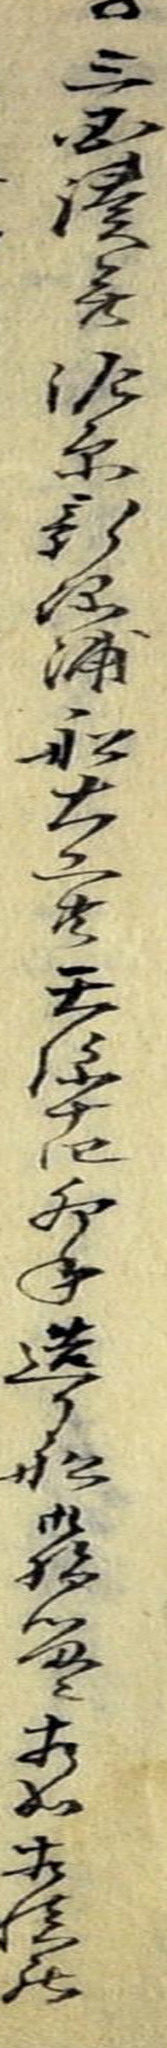○三国湊并泥原新保浦船大工共天保十四卯年造り船御指留に相成相慎居
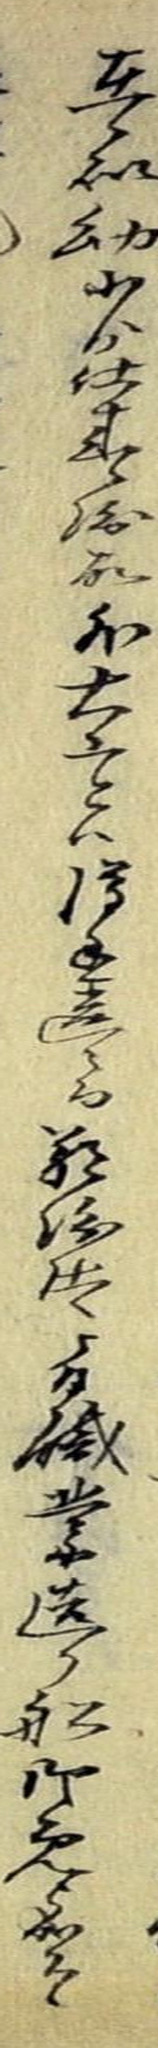在候処幼少ゟ仕来候儀故外大工とは得手違に而難儀仕候に付職業造り船御免被成下候
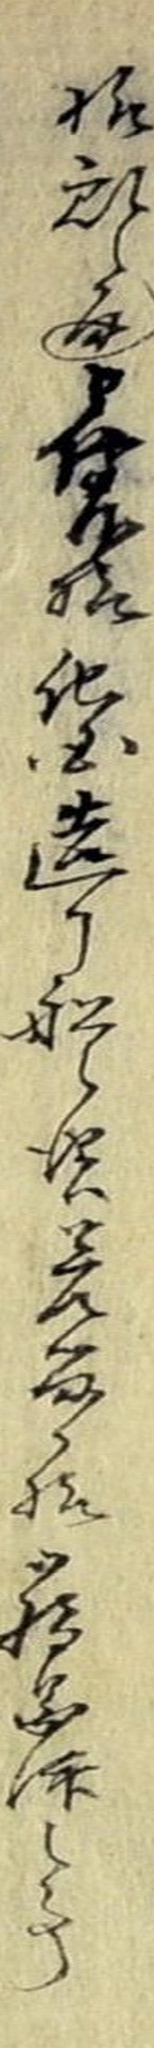様願之通申付候様他国造り船之儀は差留候樣御指図済之事
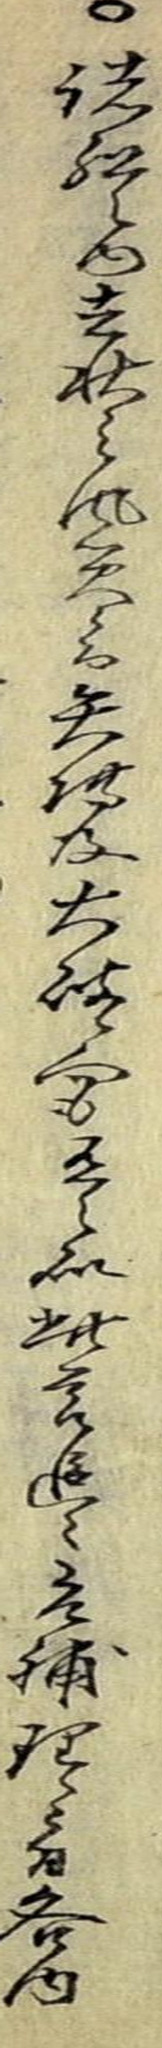○諸組之内去秋之風災に而矢場及大破候向も有之処此節追々取補理候に付各内
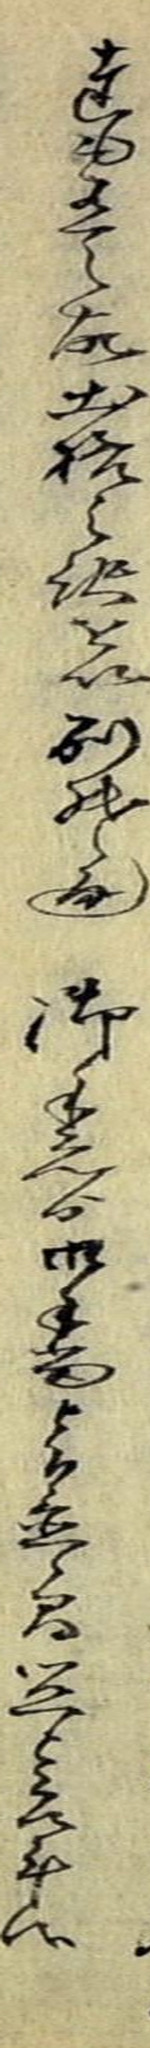達も有之故出格之訳を以別紙之通御手元ゟ御手当被下置候間宜被取斗候
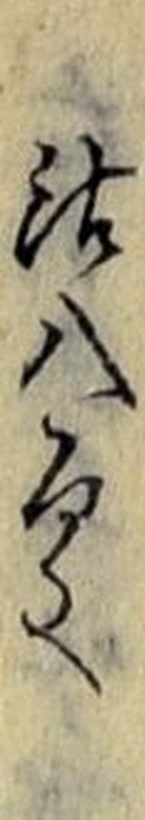銀八百匁
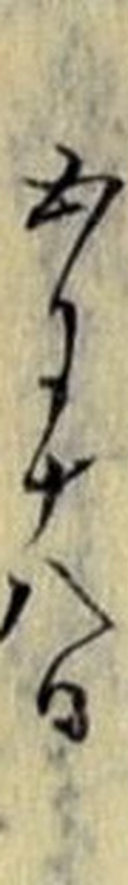五月十八日
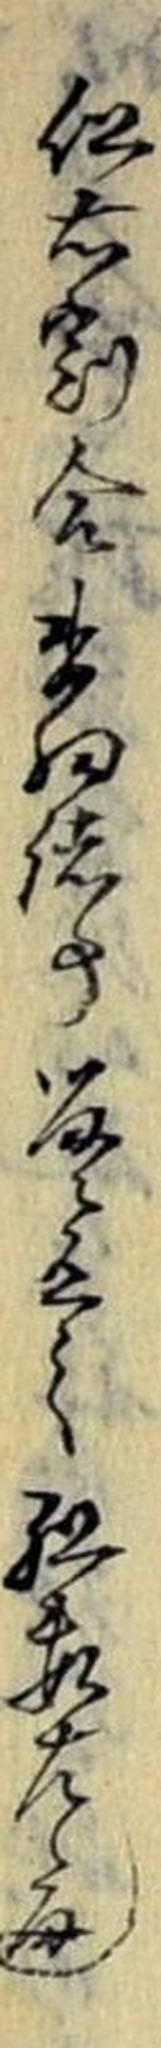但右割金委細諸事留に有之組数左之通
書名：命令之部 六
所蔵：福井県文書館 Fukui Prefectural Archives
